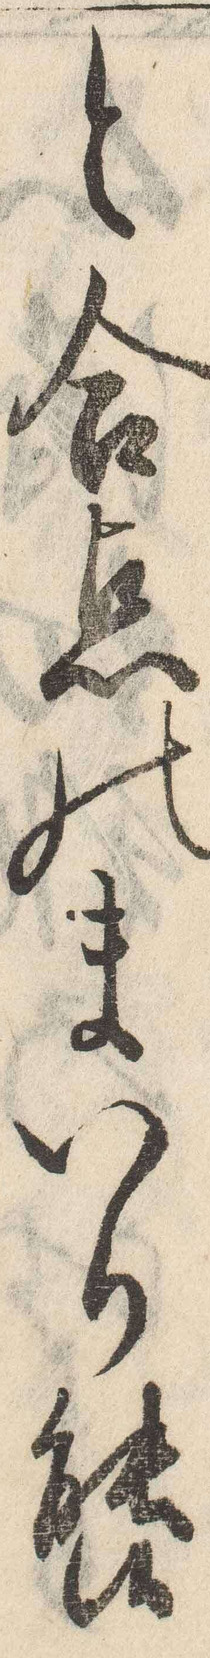と合点のまいり能候
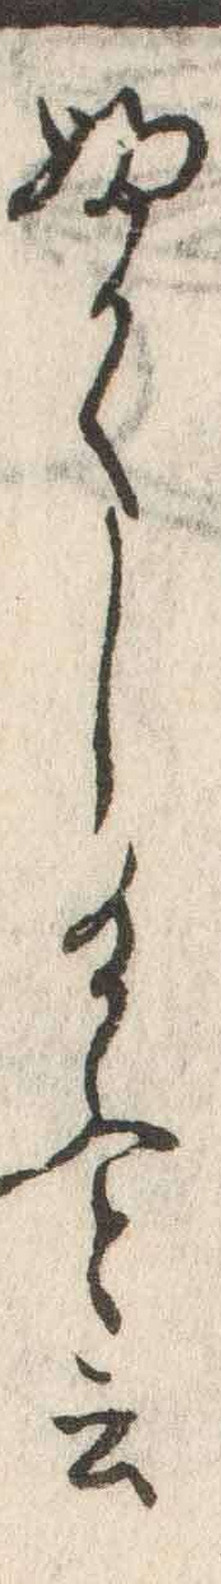ふかくし給ふと云
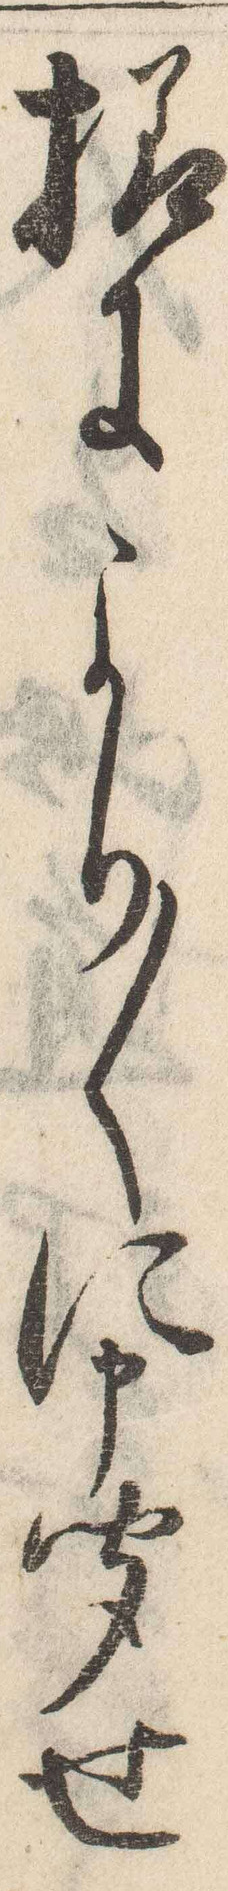様により〳〵に申聞せ
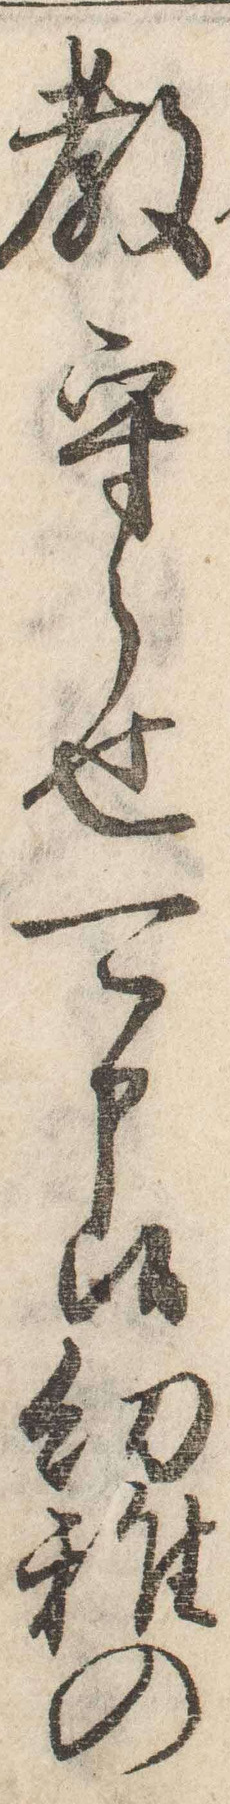教守らせ可申候幼稚の
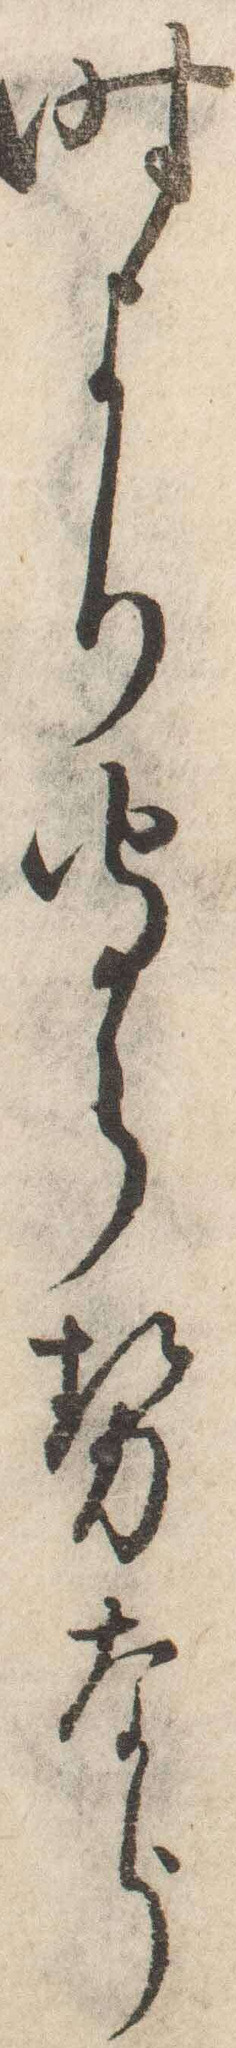時より守らせなら
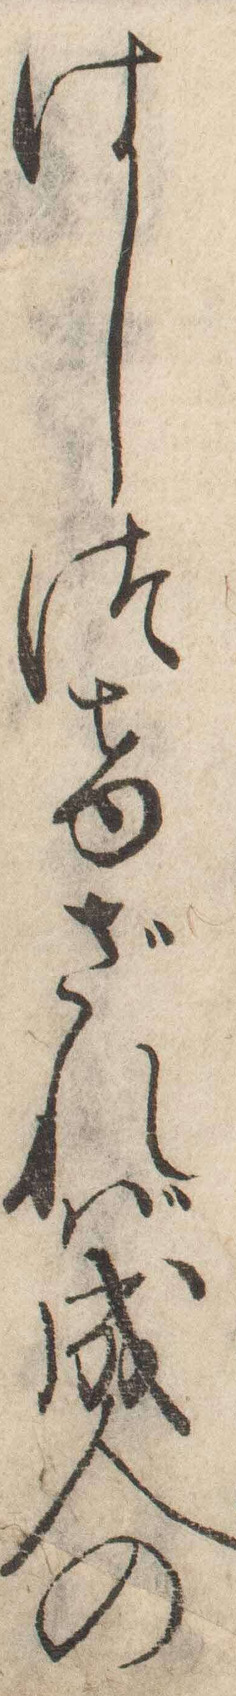はしつけざれば成人の

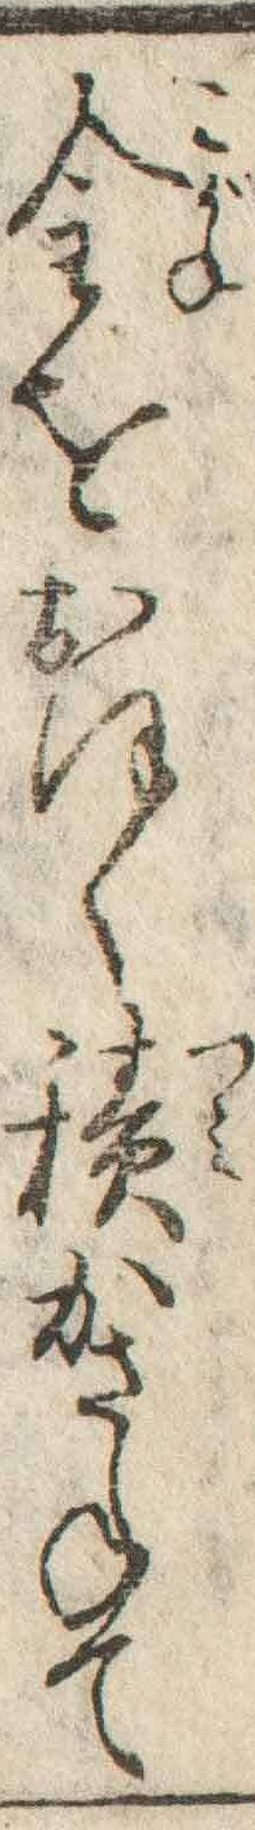金をおほく積かさねて
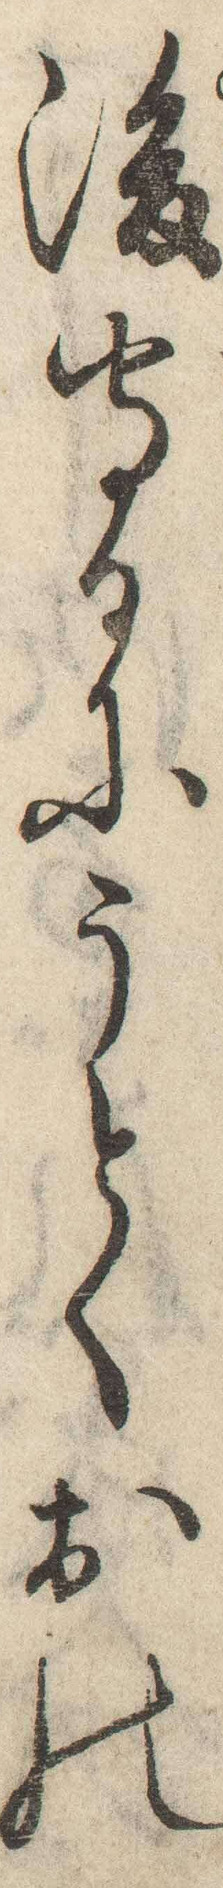後守るにうとくおの
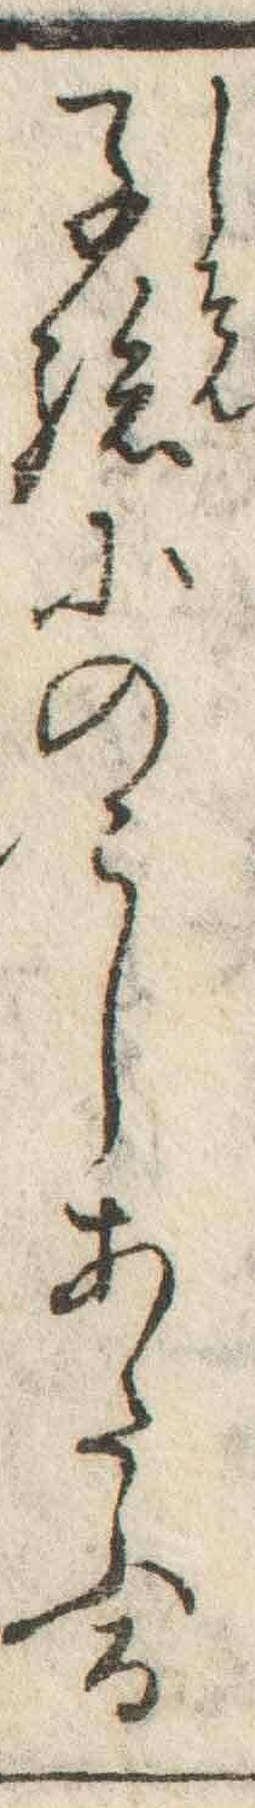子孫にのこしあたふる
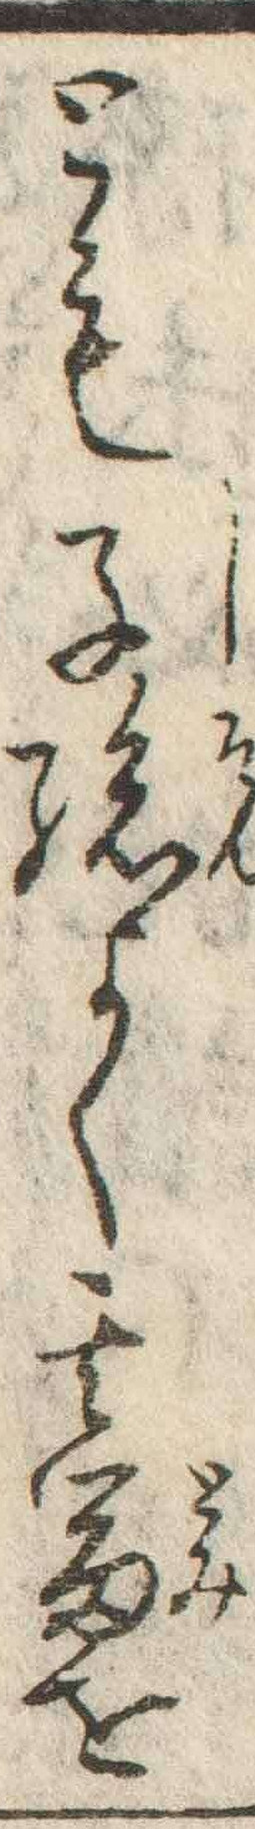とも子孫よく其富を
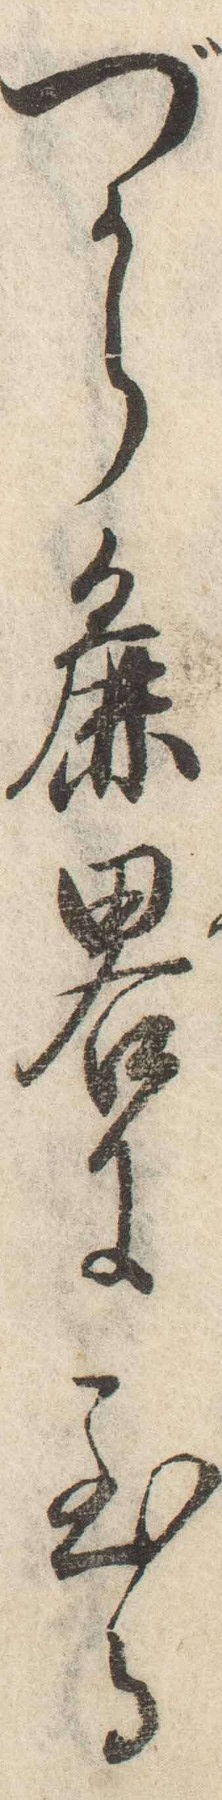づから麁略に至る
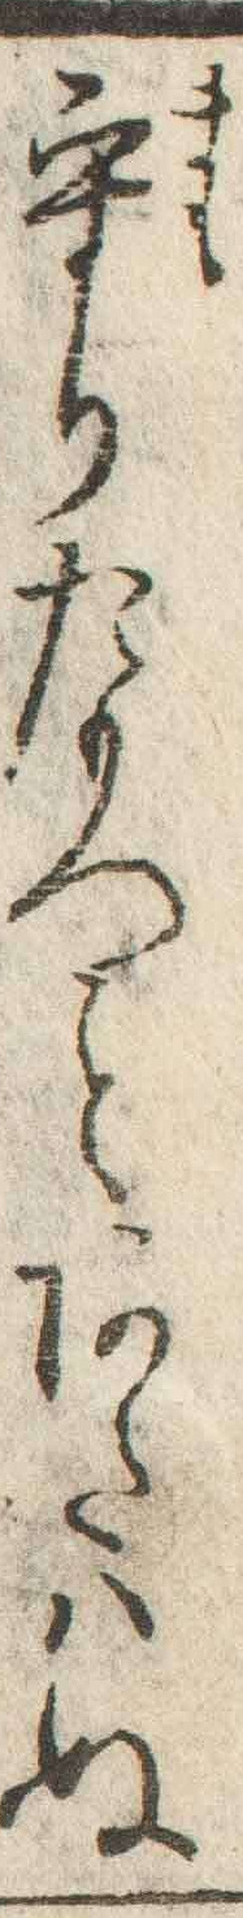守りたもつことあたはぬ
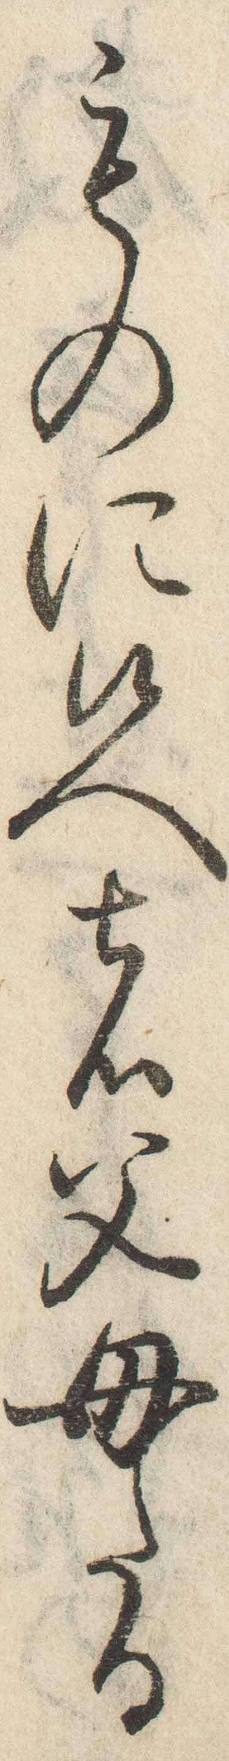ものに候へは父母たる
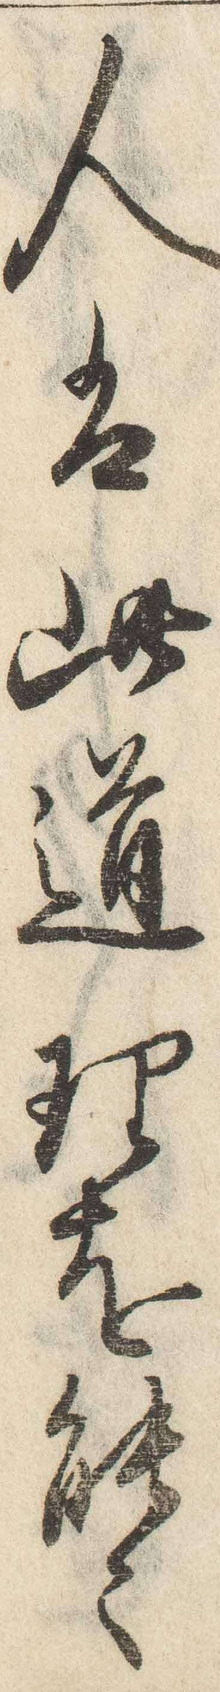人は此道理を能々
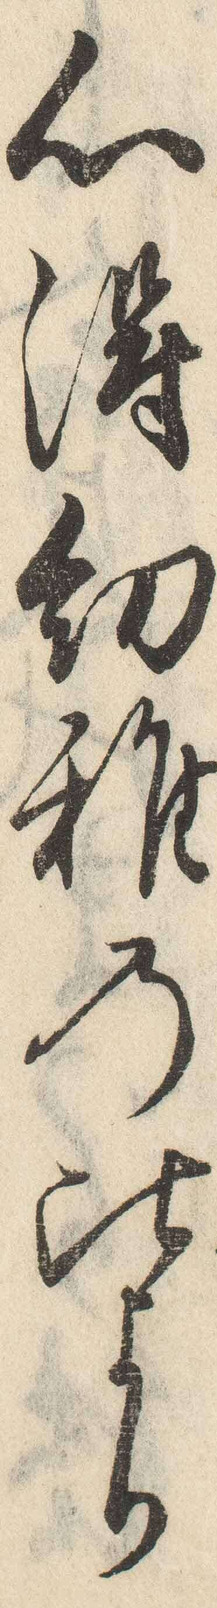心得幼稚の比より
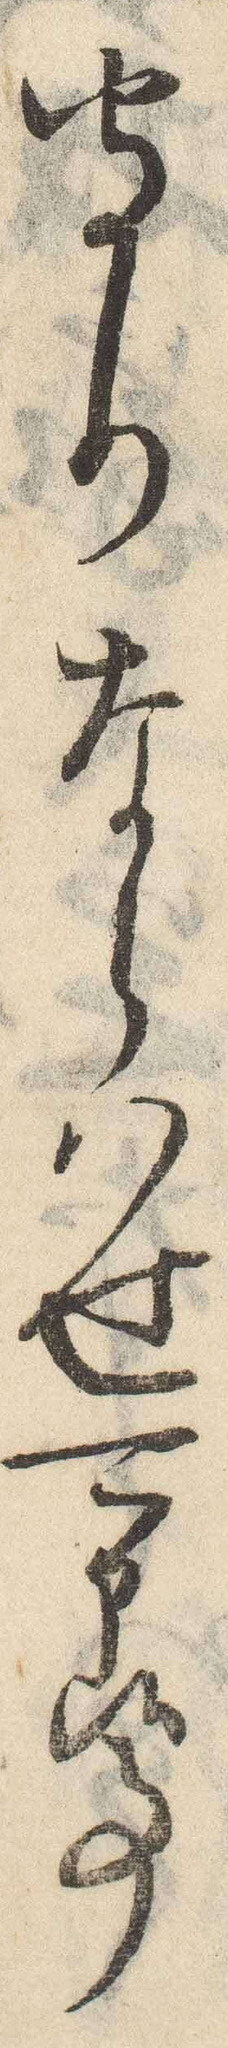守りならはせ可申候事
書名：撫育草
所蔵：東京学芸大学附属図書館 国文学研究資料館
